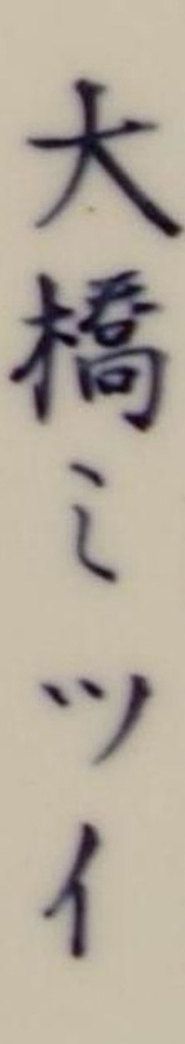大橋ミツイ
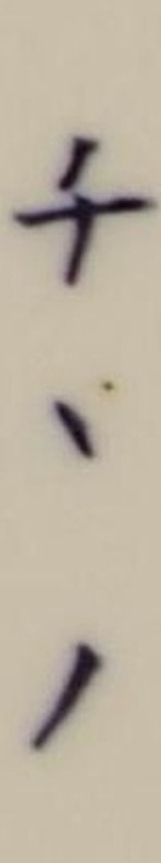チヽノ
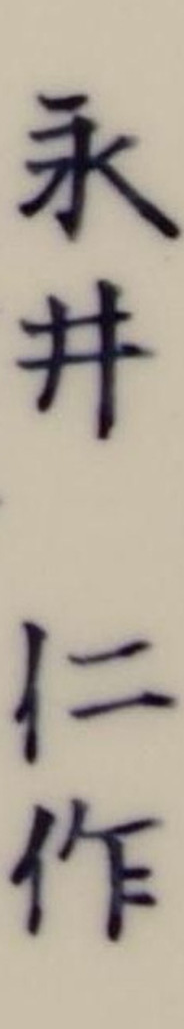永井仁作
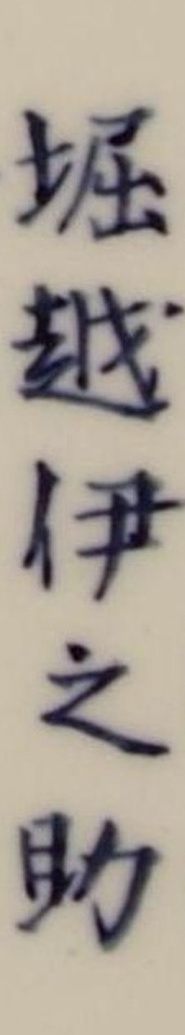堀越伊之助
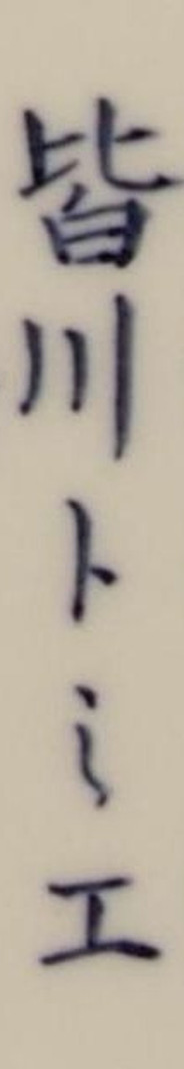皆川トミエ
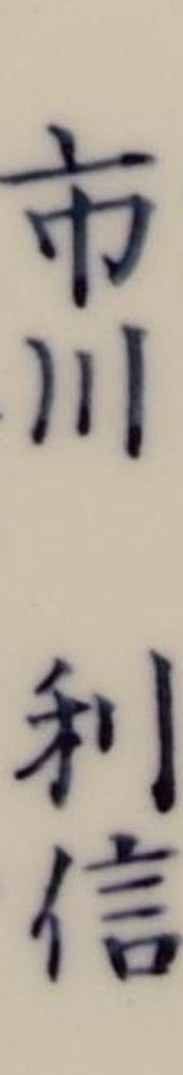市川利信
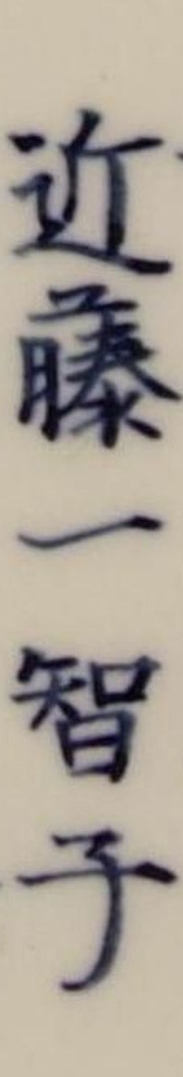近藤一智子
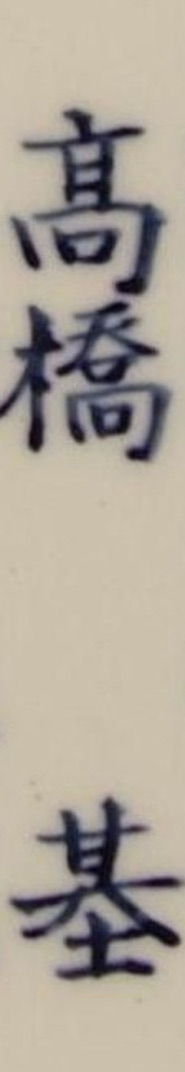高橋基
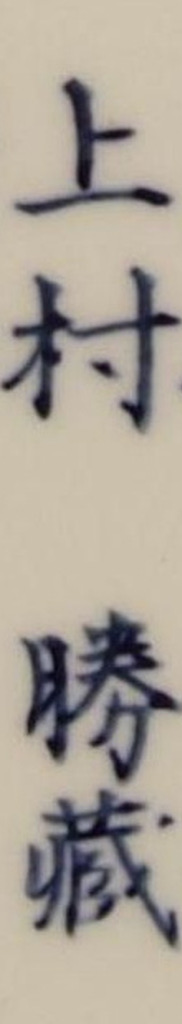上村勝蔵
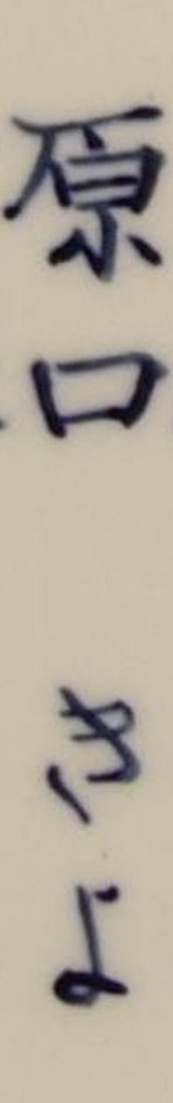原口きよ
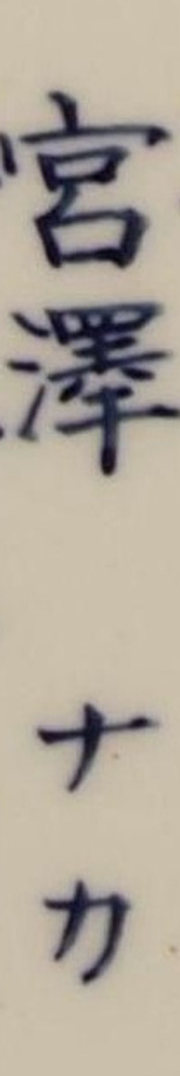宮澤ナカ
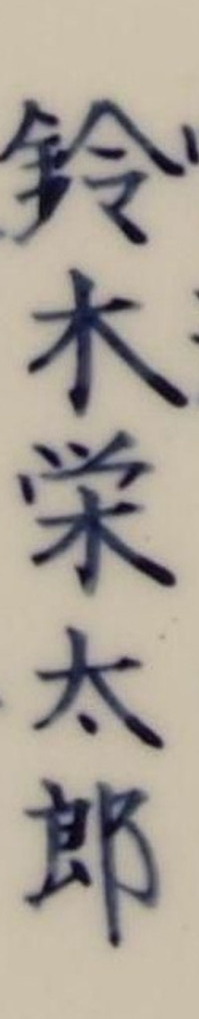鈴木栄太郎
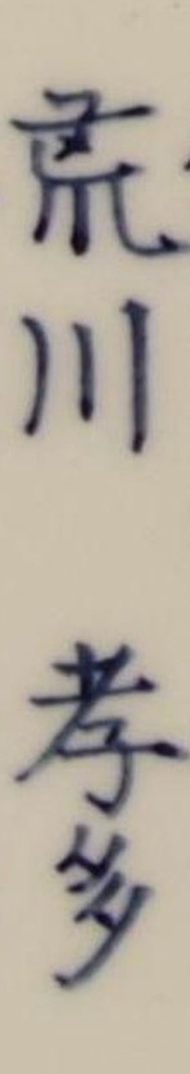荒川孝多
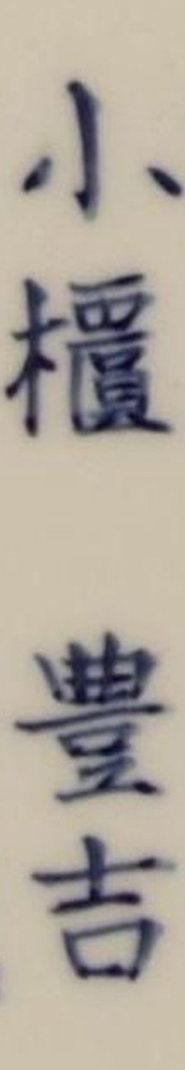小櫃豊吉
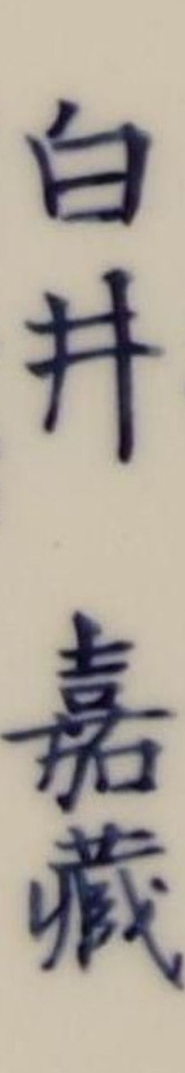白井嘉蔵
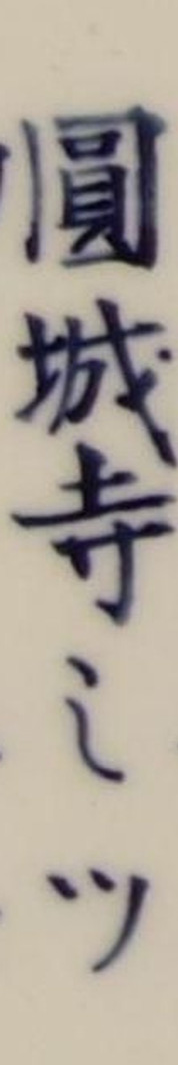圓城寺ミツ
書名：M~S
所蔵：高野山金剛峯寺
